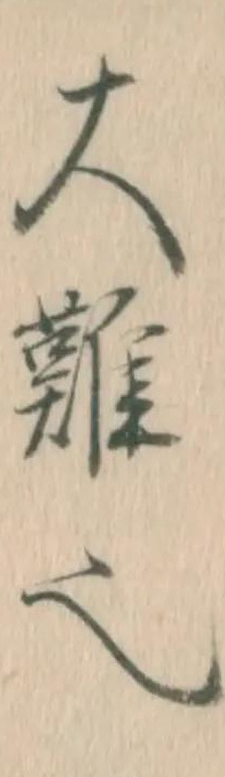大難也
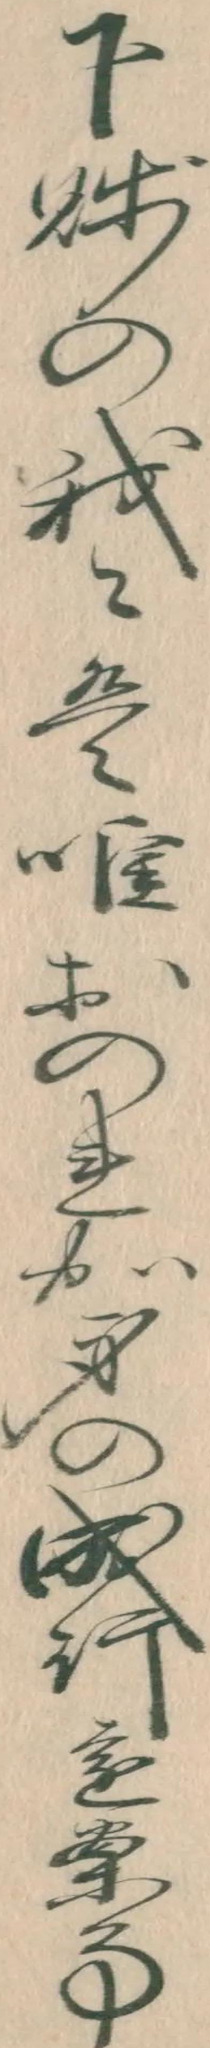下賎の我〻は唯おのれが身の成行を案事
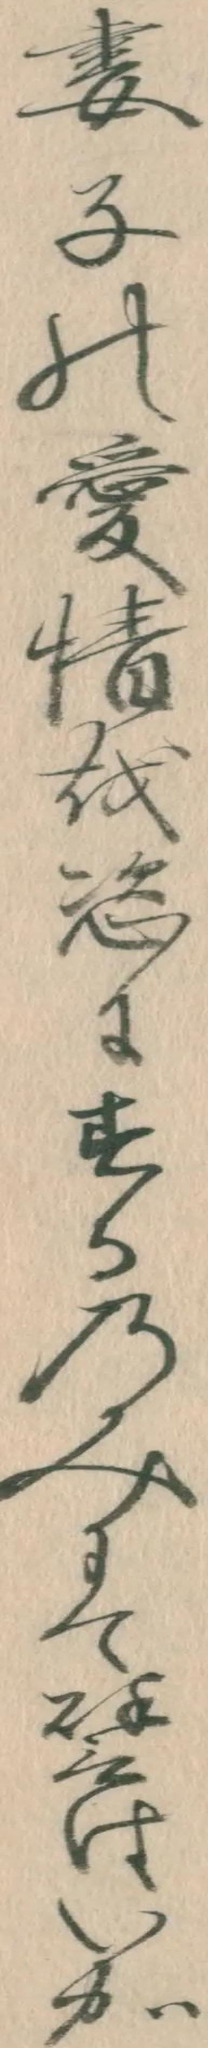妻子の愛情を恣にするのみにて譬はいか
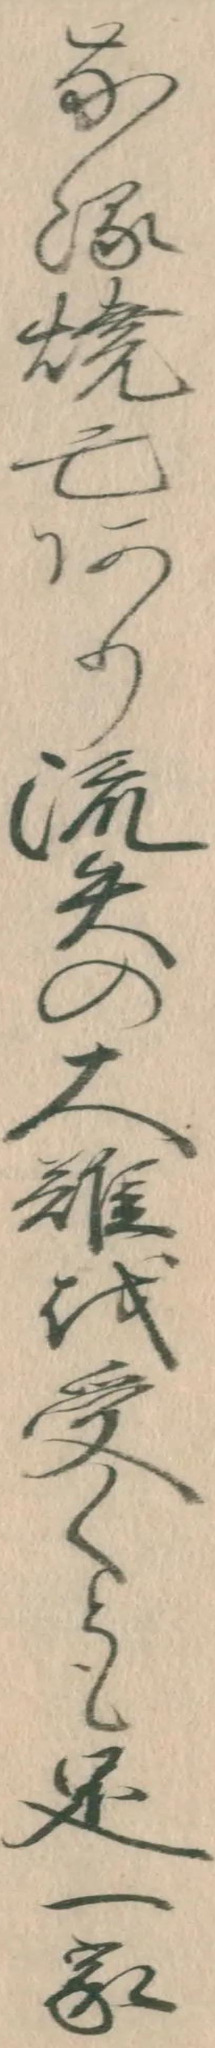なる焼亡あり流失の大難を受くとも是一家
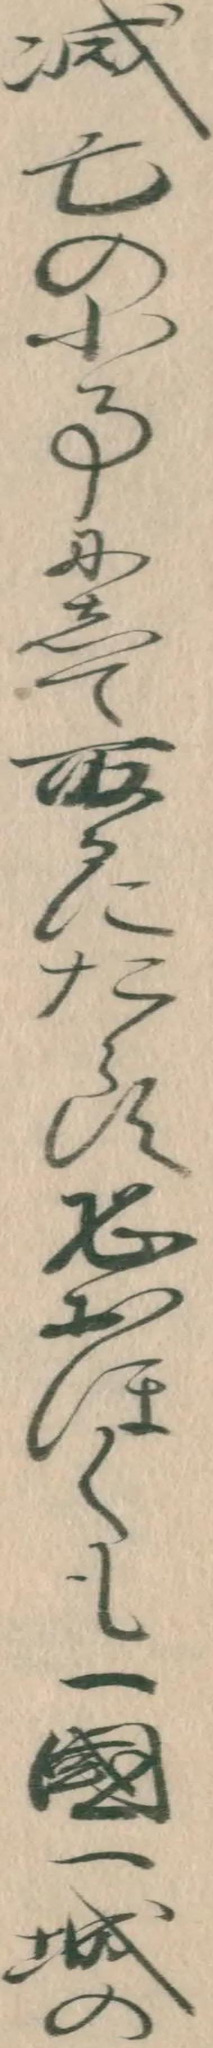滅亡の小事にして取るにたらす恐おほくも一国一城の
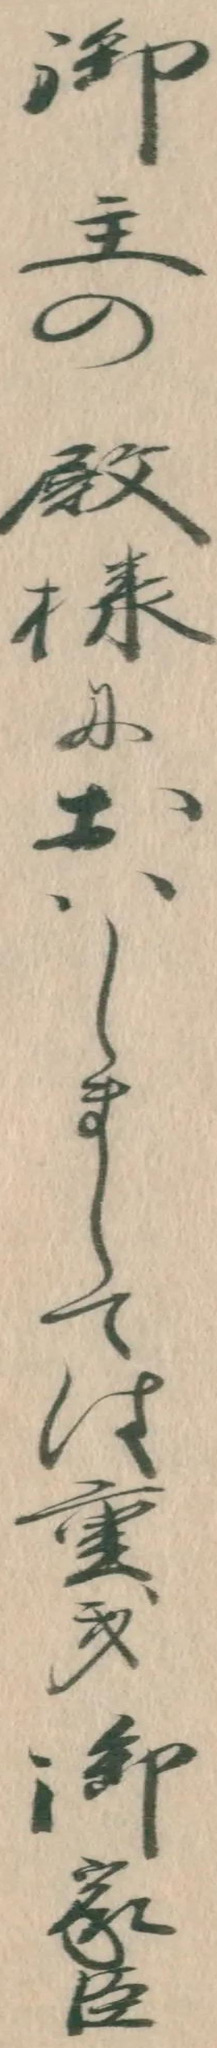御主の殿様におはしましては重き御家臣
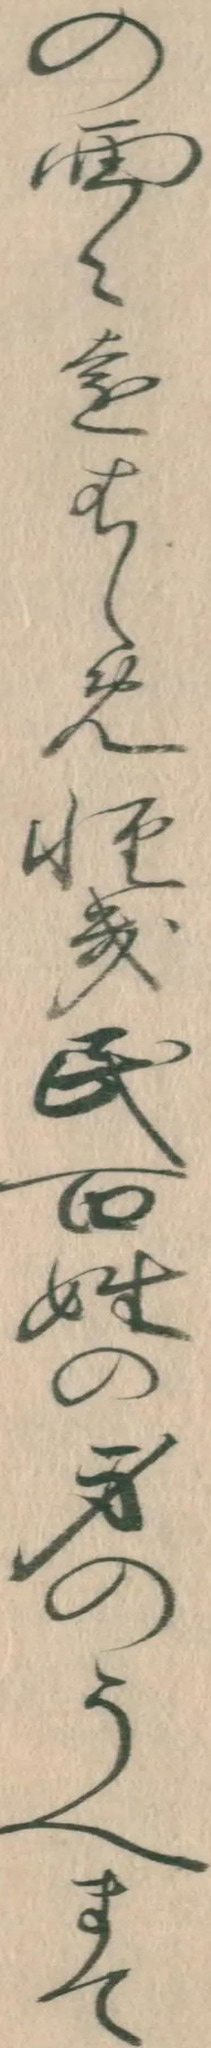の面〻をはしめ軽き民百姓の身のうへまて
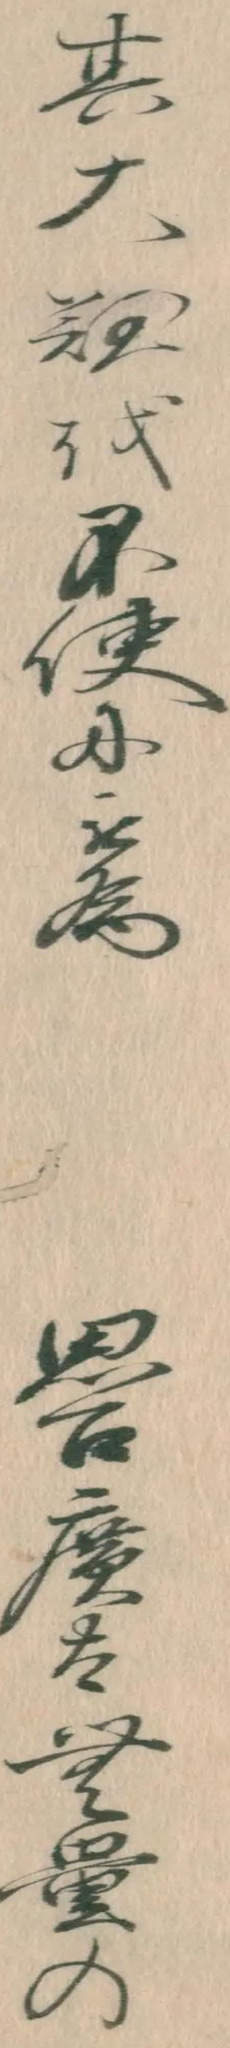其大難を不便に被為思召広太無量の
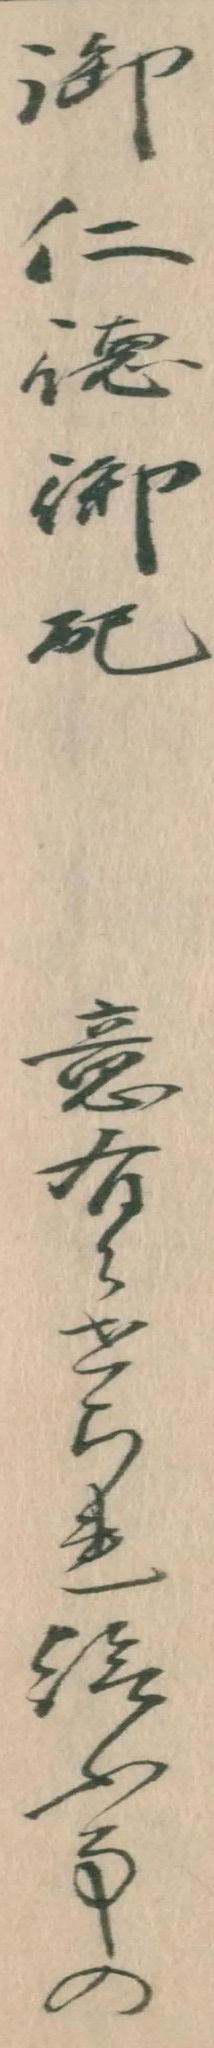御仁徳御配意有らせられ給ふ事の
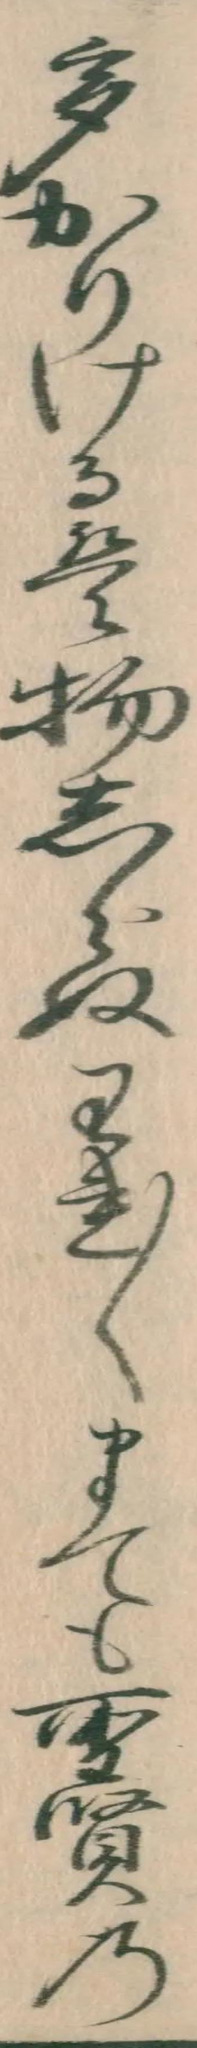多かりけるは物しらぬわれ〳〵まても聖賢の
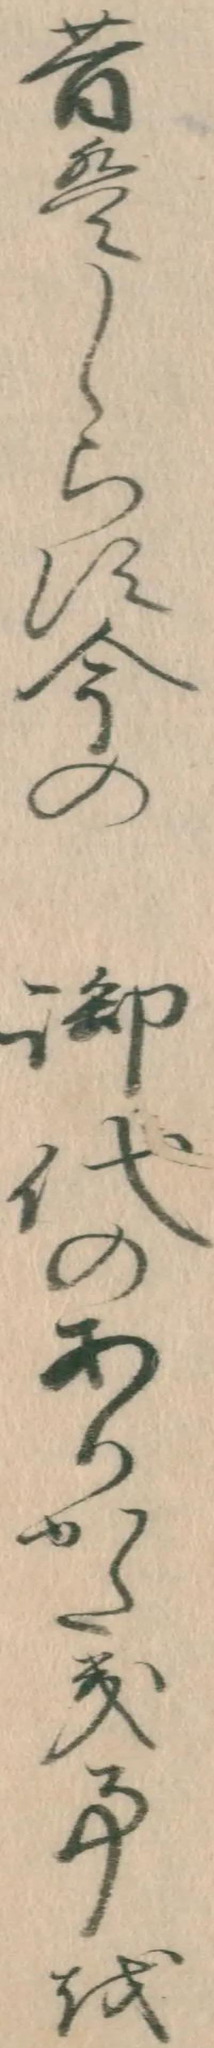昔はしらす今の御代のありかたき事を
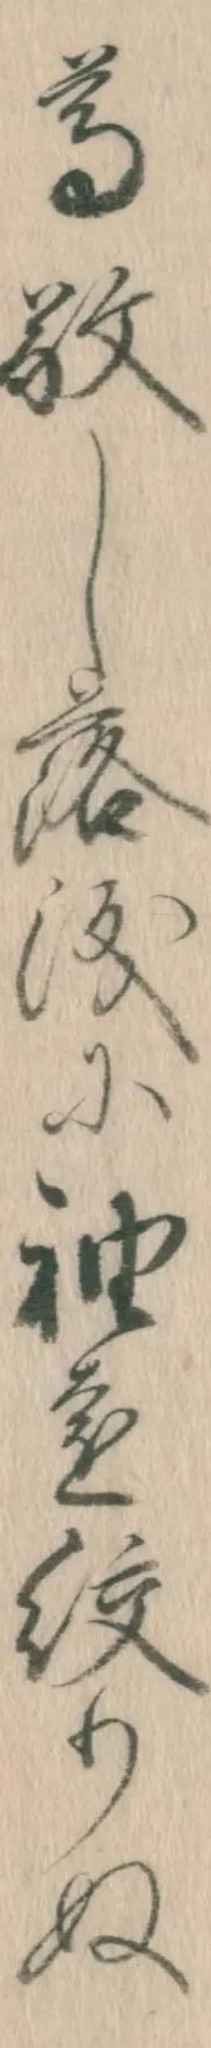尊敬し落涙に袖を絞りぬ
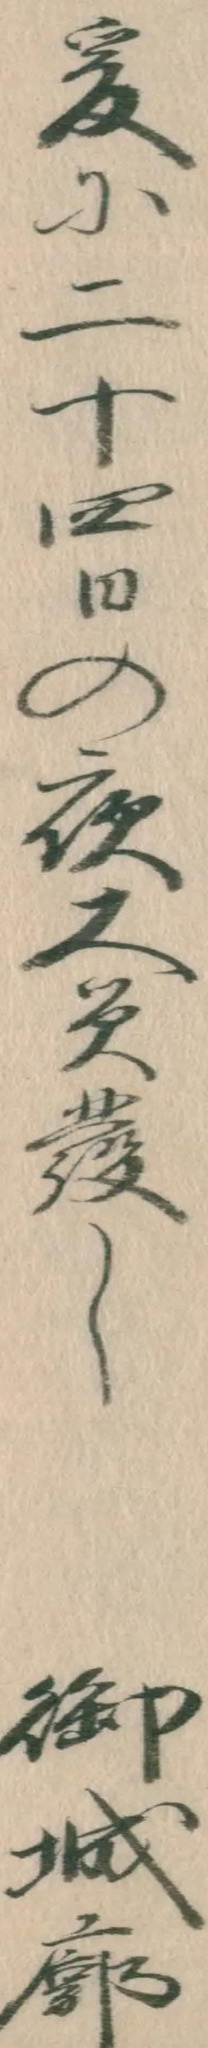爰に二十四日の夜大災発し御城廓
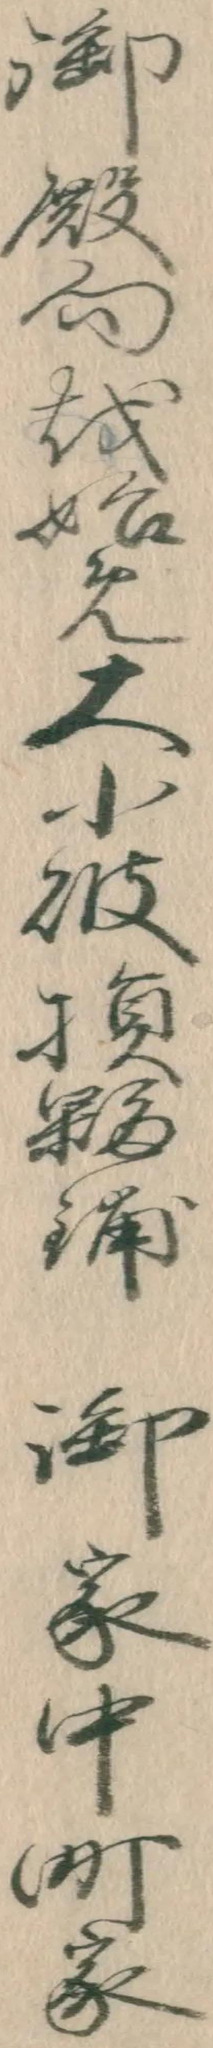御殿向を始め大小破損夥鋪御家中町家
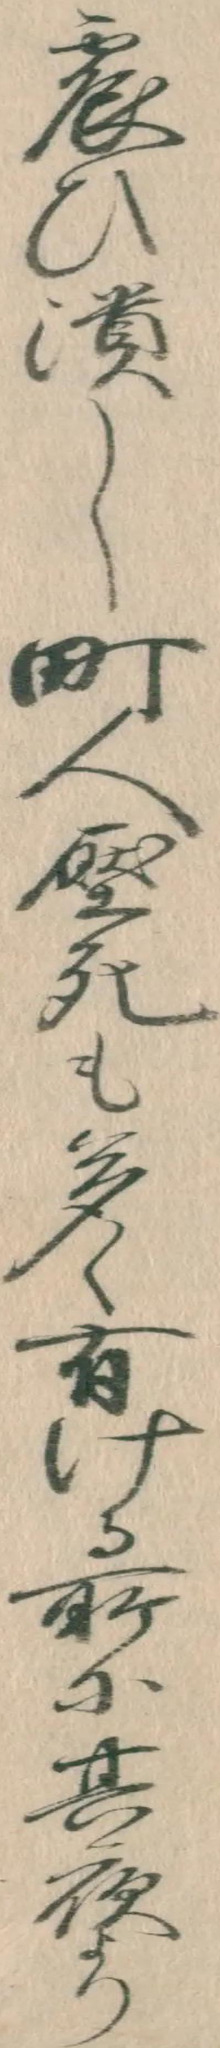震ひ潰し町人圧死も多く有ける所に其夜より
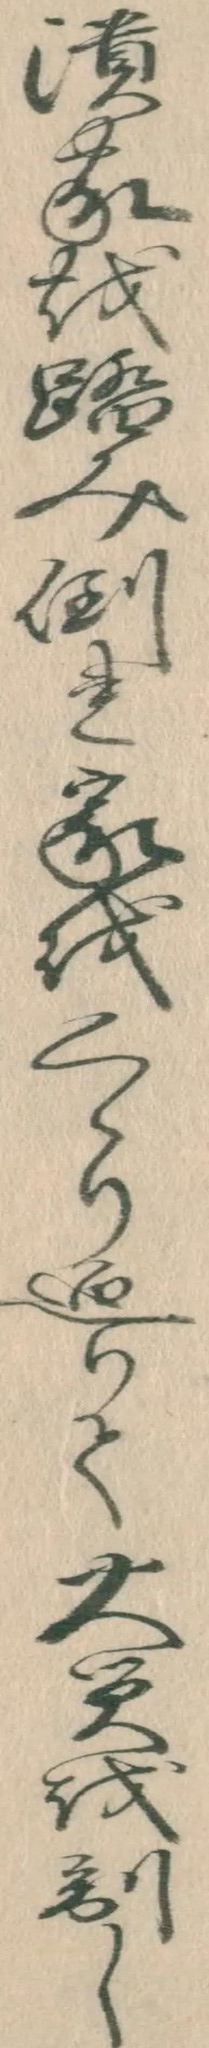潰家を踏み倒れ家をくゝり廻りて火災を制し
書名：俗語之種. [6]
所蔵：国立国会図書館 National Diet Library, JAPAN
